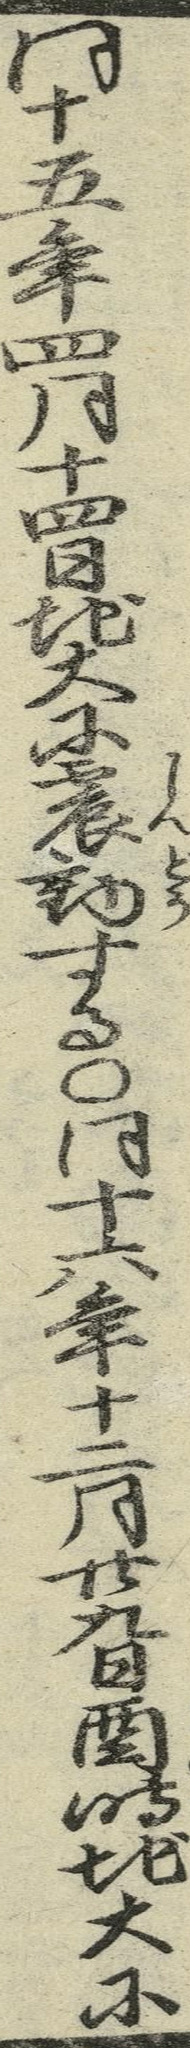同十五年四月十四日地大に震動する◯同十六年十二月廿九日酉時地大に
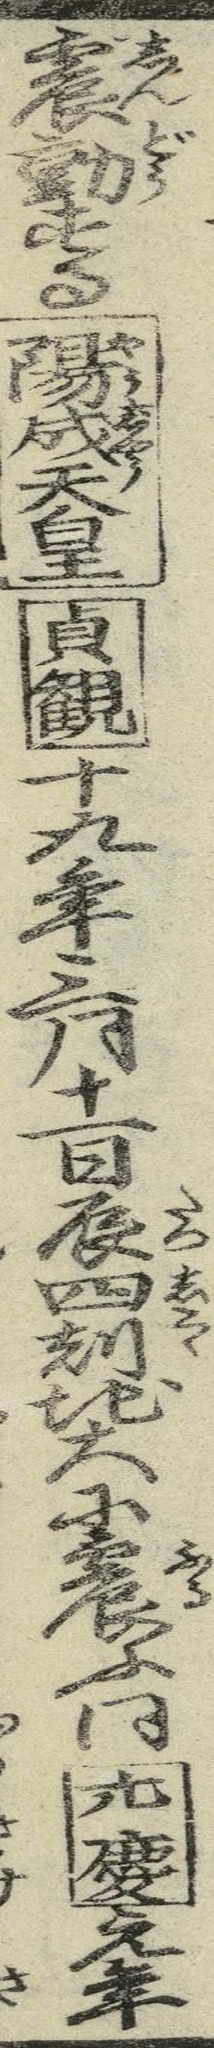震動する陽成天皇貞観十九年三月十一日辰四刻地大に震ふ同元慶元年
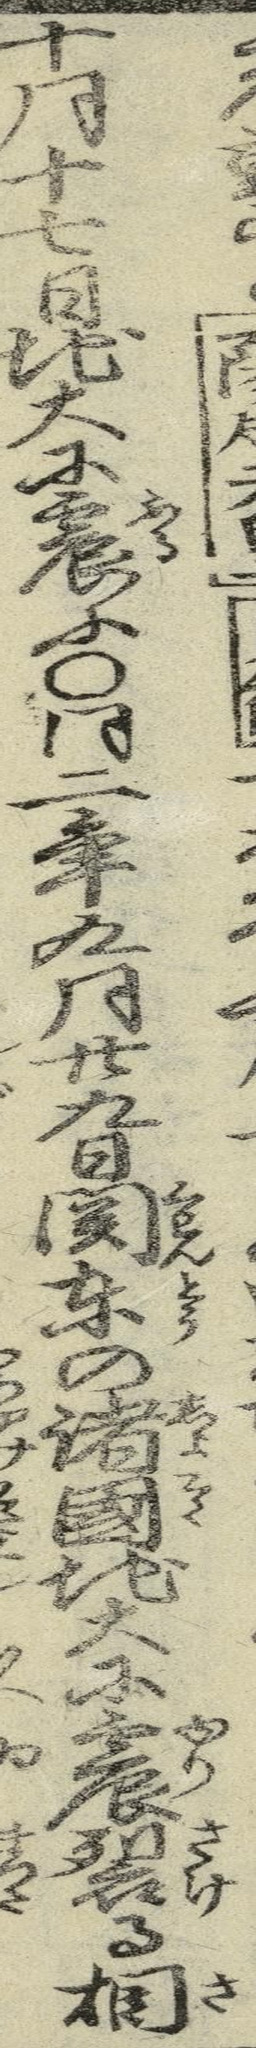十月十七日地大に震ふ◯同二年九月廿九日関東の諸国地大に震裂る相
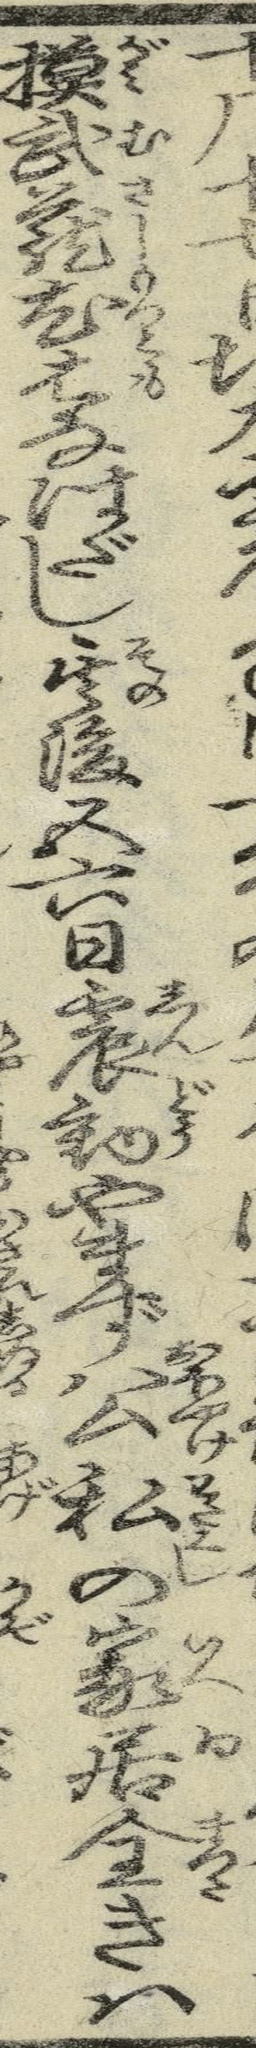模武蔵尤はなはだし其後五六日震動やまず公私の家居全きは
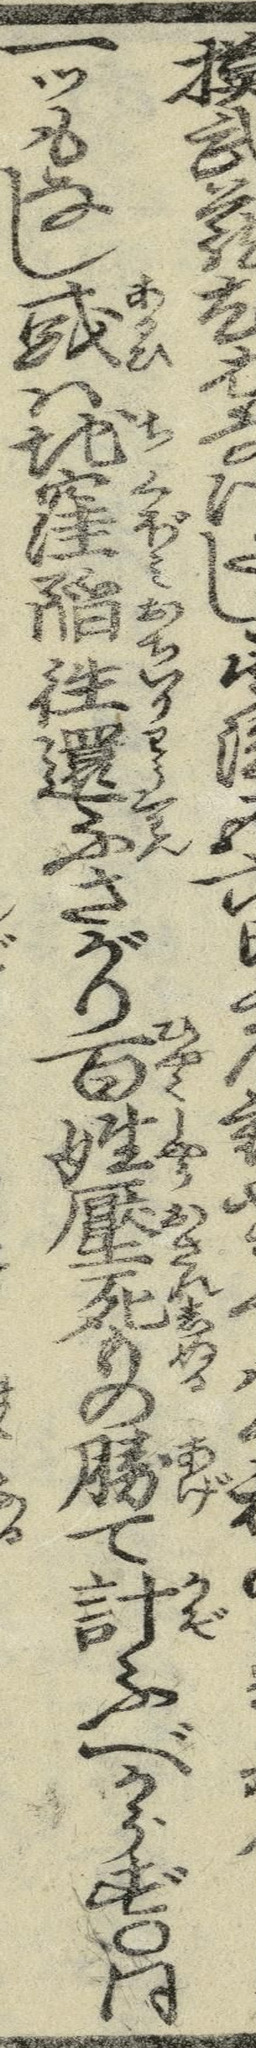一ツもなし或は地窪陥往還ふさがり百姓圧死もの勝て計ふべからず◯同
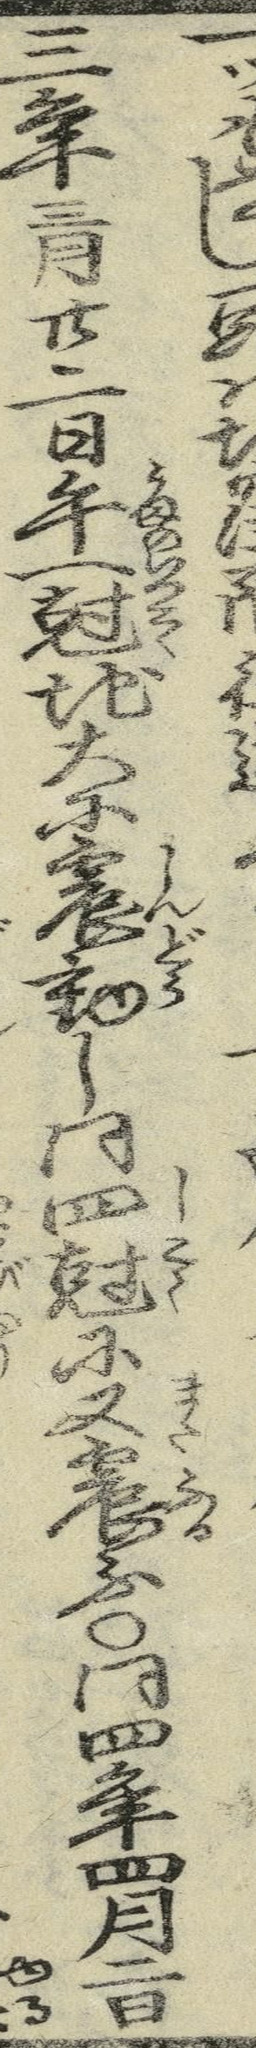三年三月廿二日午一刻地大に震動し同四尅に又震ふ◯同四年四月二日
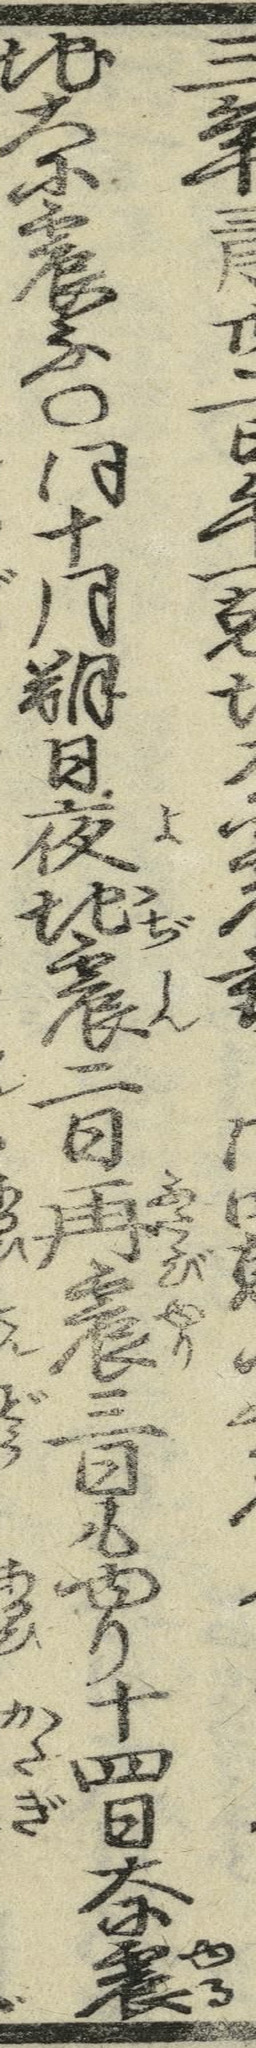地大に震ふ◯同十月朔日夜地震二日再震三日もゆり十四日大に震
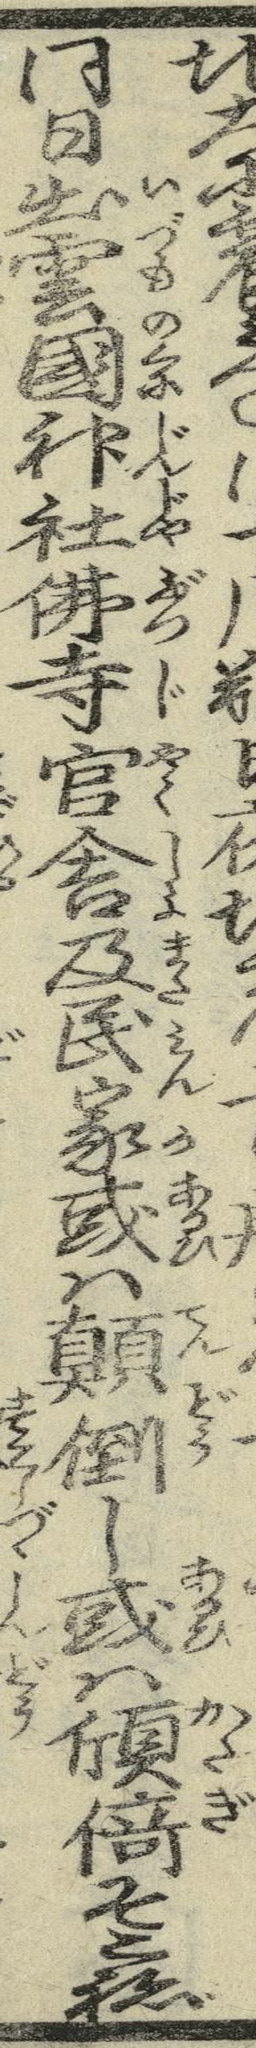同日出雲国神社仏寺官舎及民家或は顛倒し或は傾倚そこね
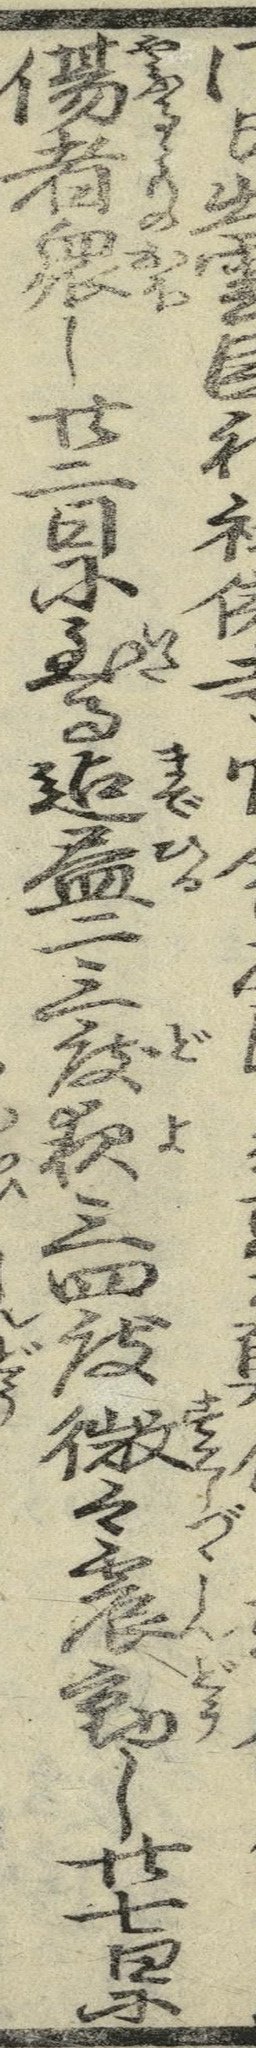傷者衆し廿二日に至る迄昼二三度夜三四度微々震動し廿七日に
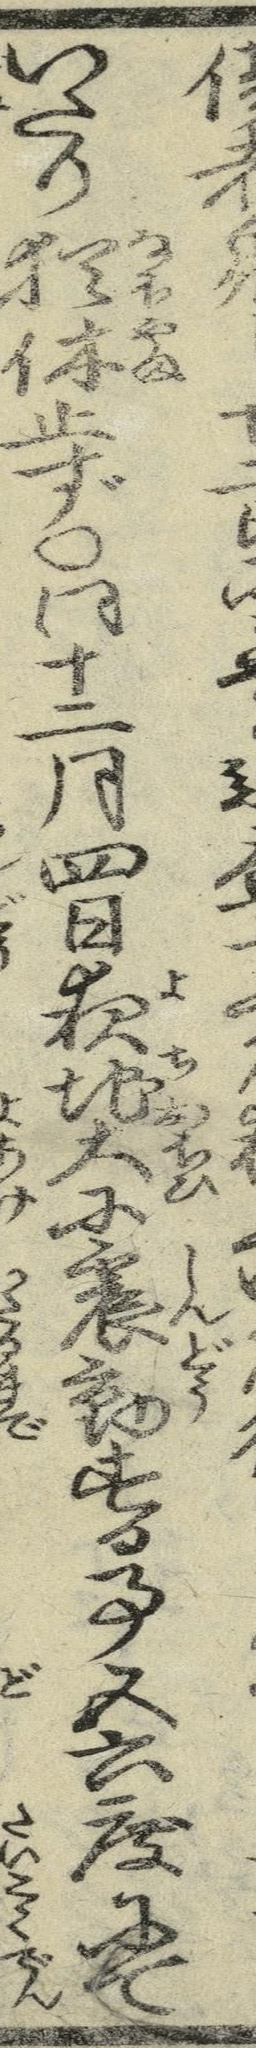いたり猶休止ず◯同十二月四日夜地大に震動する事五六度にて
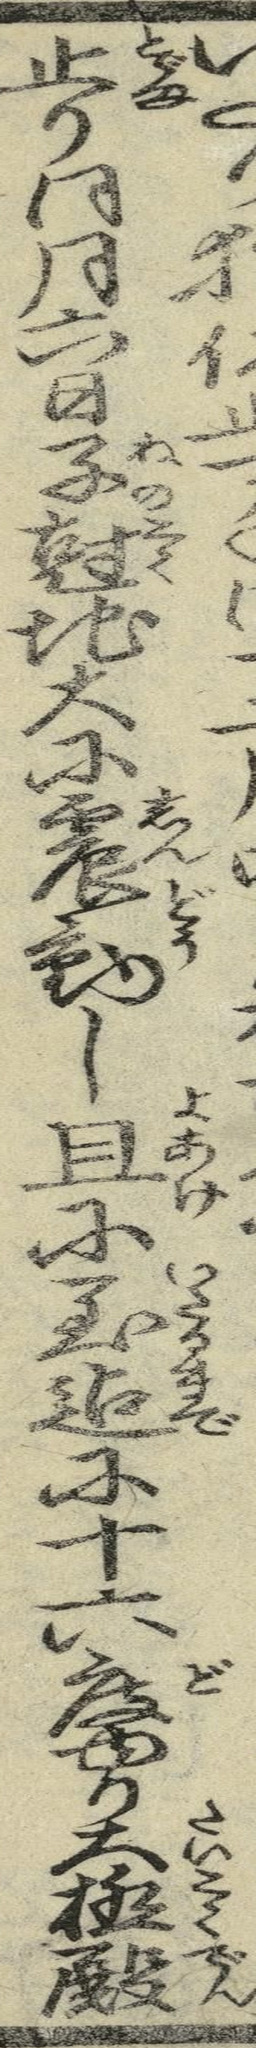止り同月六日子尅地大に震動し且に至迄に十六度ゆり大極殿

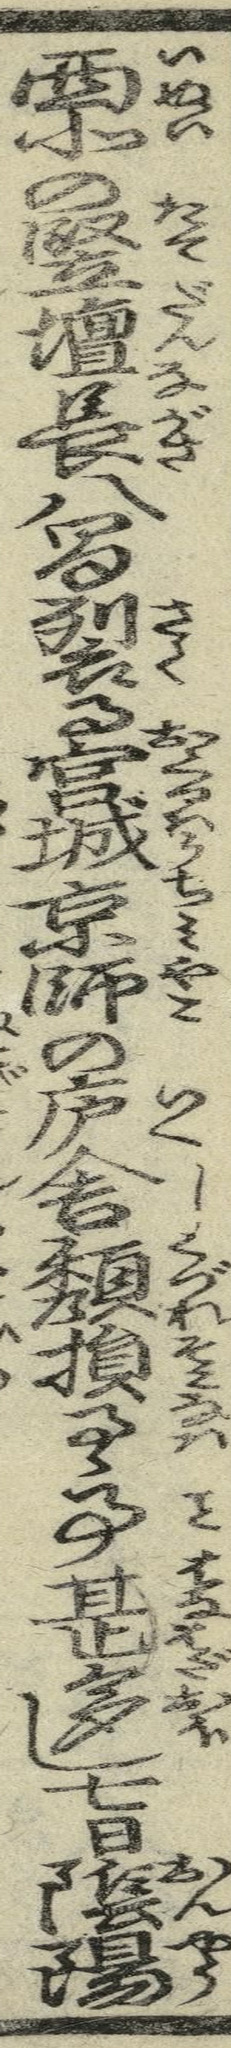西北の竪壇長八間裂る宮城京師の廬舎頽損る〻事甚多し七日陰陽
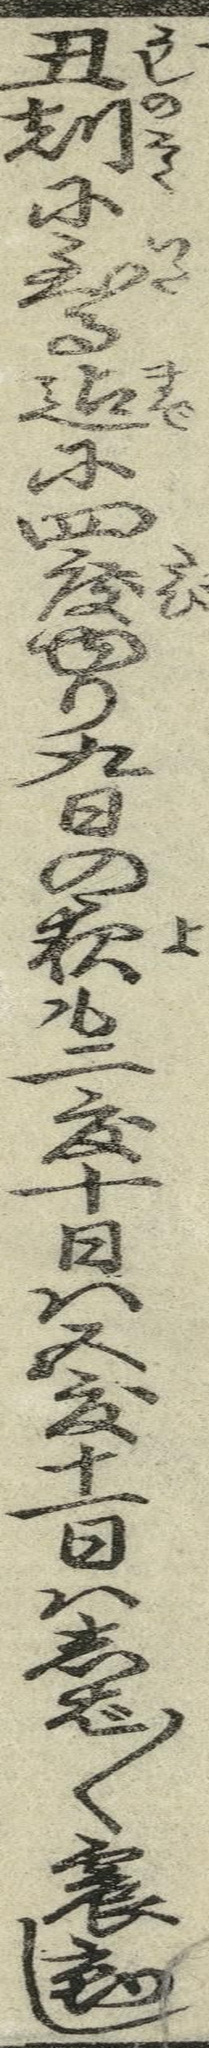丑刻に至る迄に四度ゆり九日の夜も二度十日は五度十一日はしば〳〵震動し
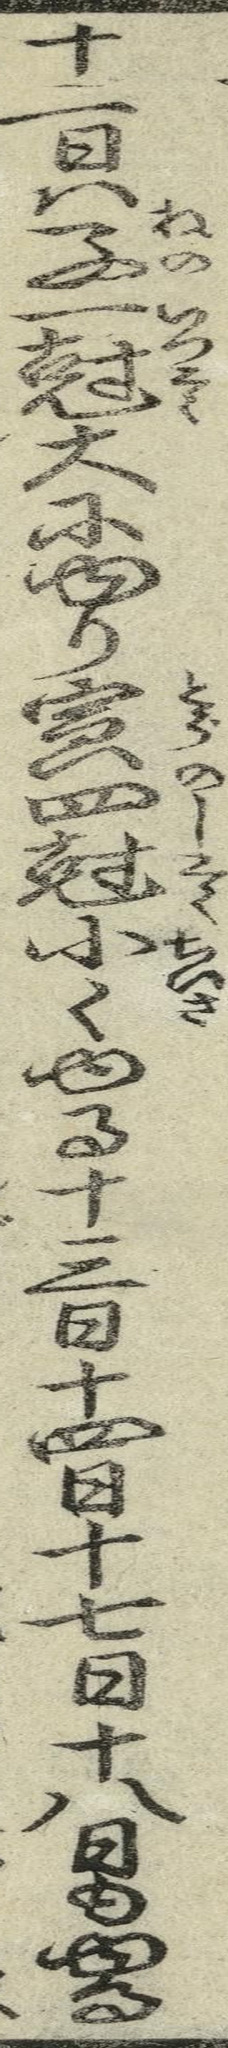十二日は子一刻大にゆり寅四刻小くゆる十三日十四日十七日十八日もゆる
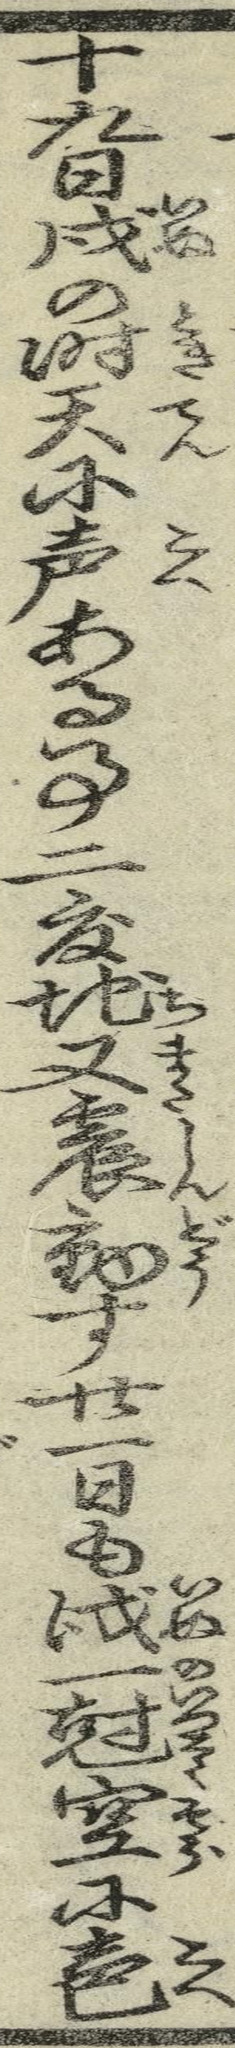十九日戌の時天に声ある事二度地又震動す廿一日も戌一刻空に声
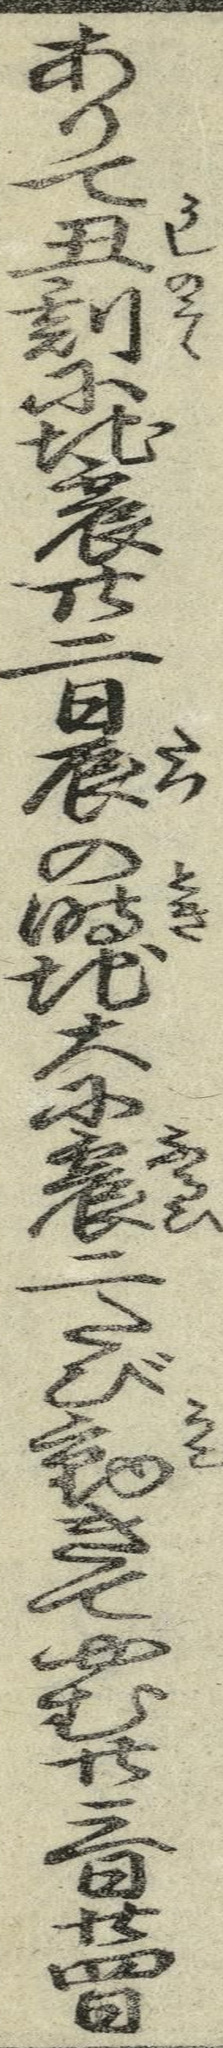ありて丑刻に地震廿二日辰の時地大に震二たび動きてやむ廿三日廿四日
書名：地震年代記
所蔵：東京大学地震研究所図書室 Earthquake Research Institute Library, The University of Tokyo, JAPAN
